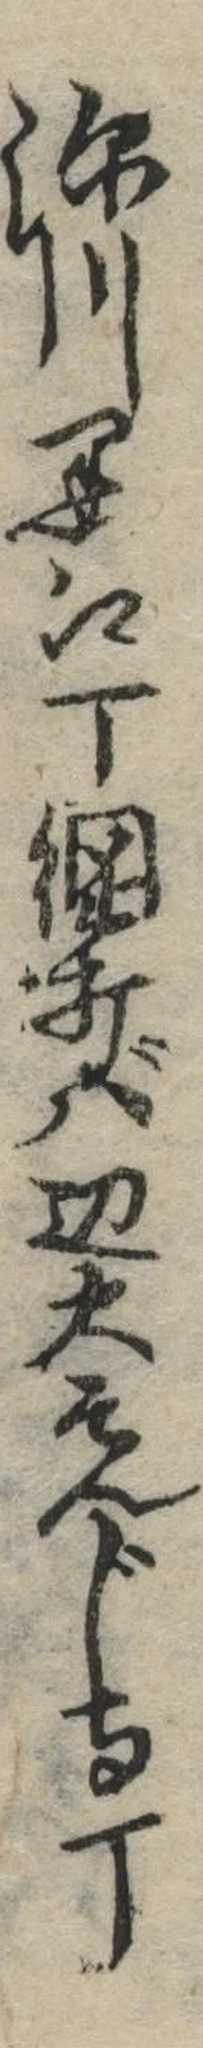深川黒江丁網打バ辺大そんじ寺丁
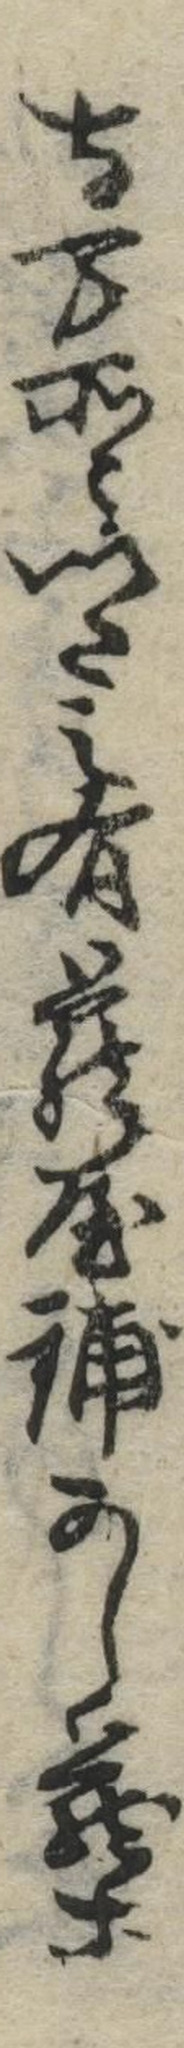寺方所〻いたミ有蔵屋舗かし蔵等
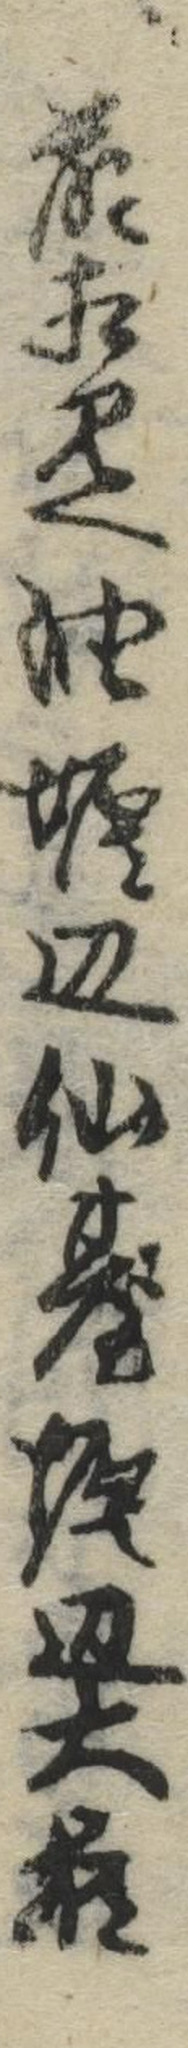崩相見へ油堀辺仙台堀辺大崩
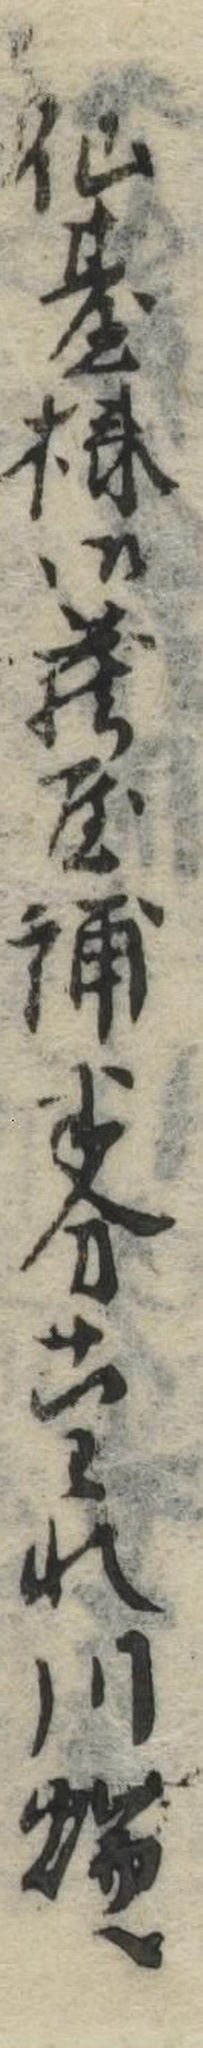仙台様御蔵屋舗半分こわれ川端へ
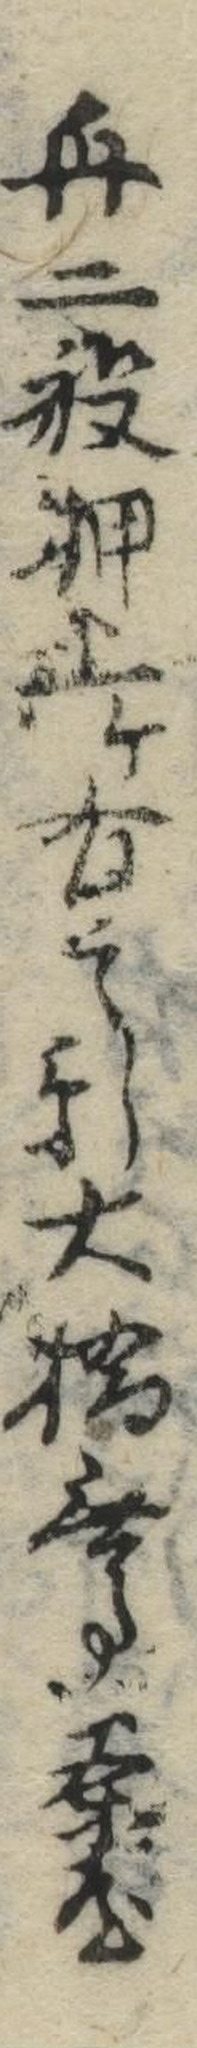舟二艘押上ケ有之新大橋無事茶屋
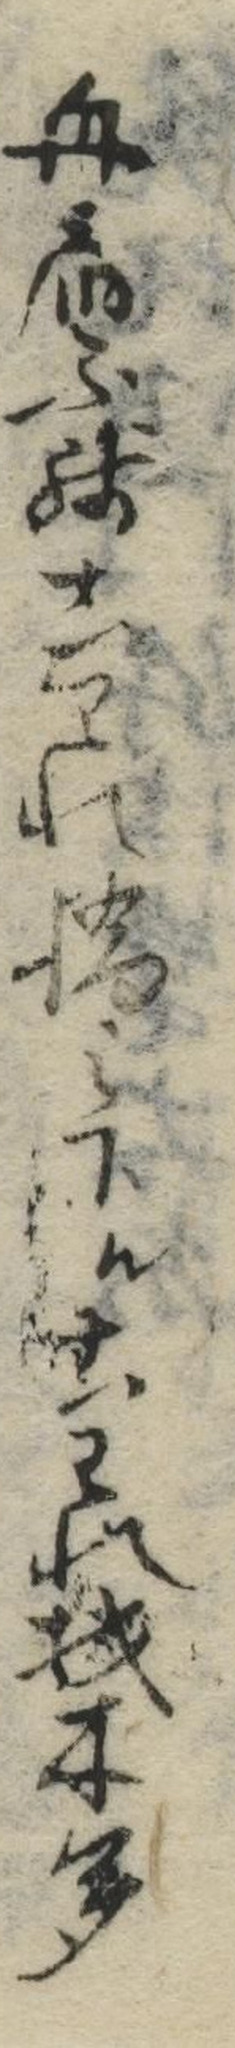舟宿不残こわれ橋之下えこわれ材木多
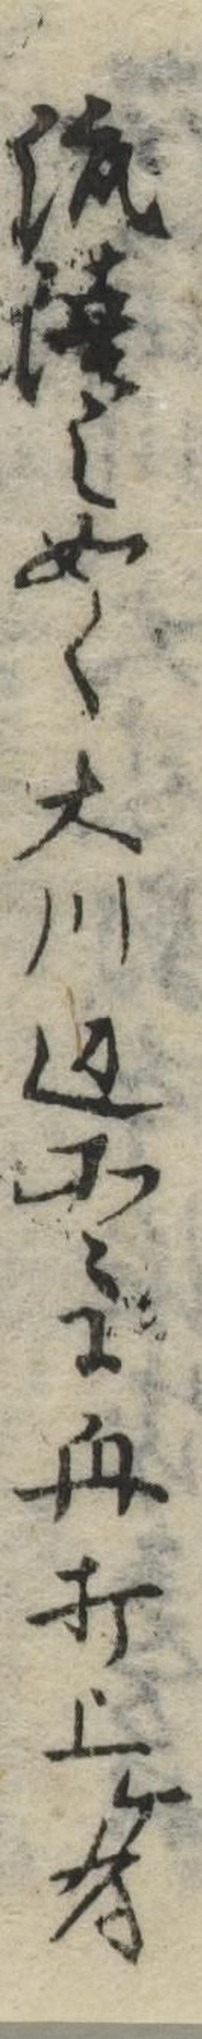流陸之如く大川辺所〻に舟打上ケ有
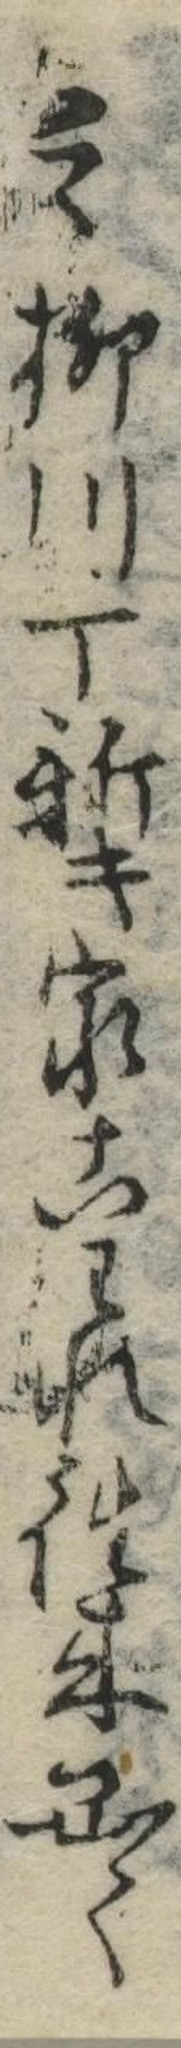之柳川丁新キ家こわれ往来無く
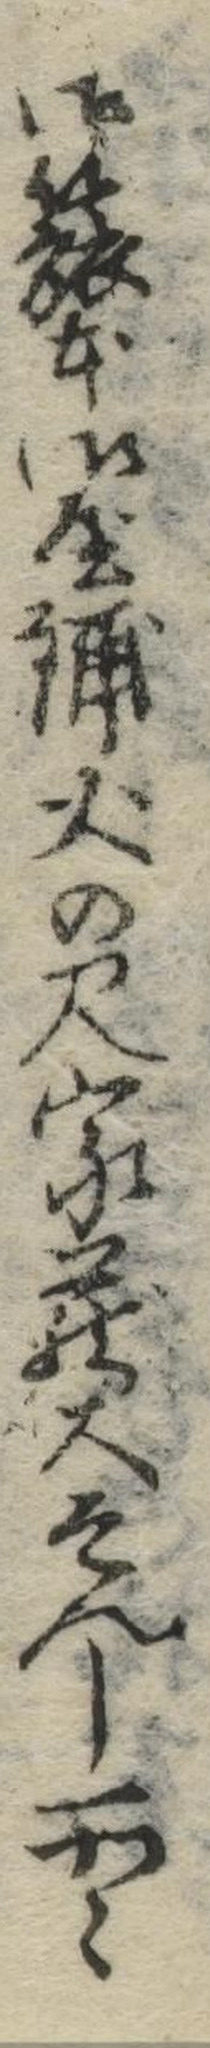御籏本御屋舗火の見家蔵大そんし所〻

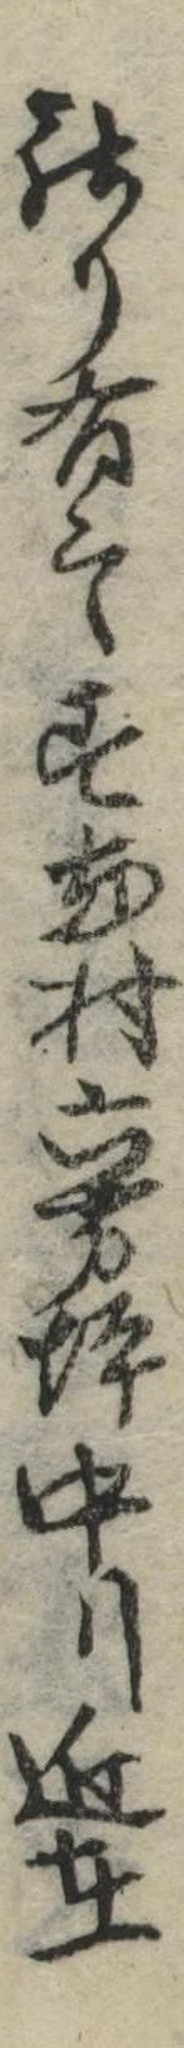残り有之すな村六万坪中引近在
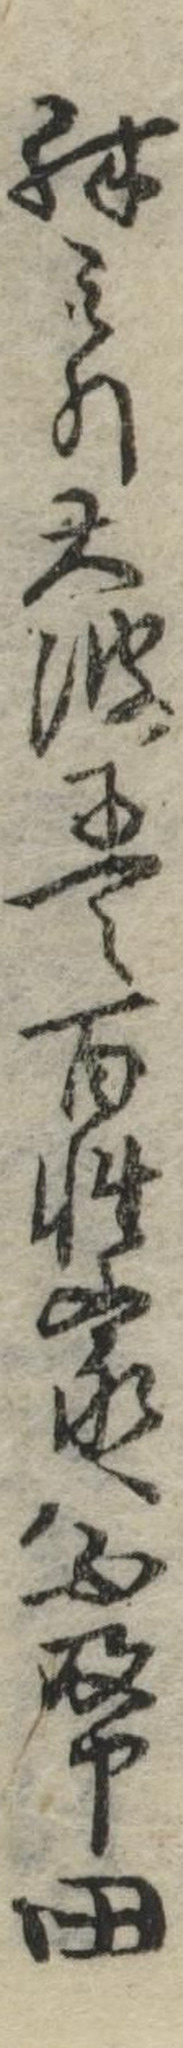殊之外大波にて百性家ハ不及申田
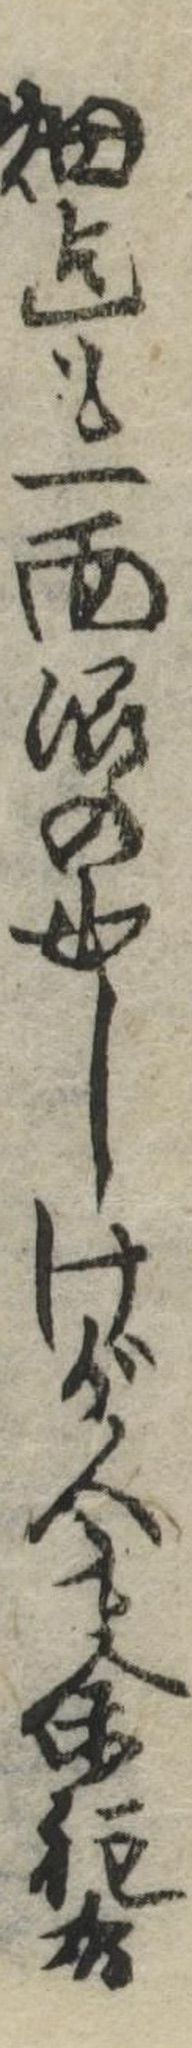畑迄も一面泥の如しけが人も余程有
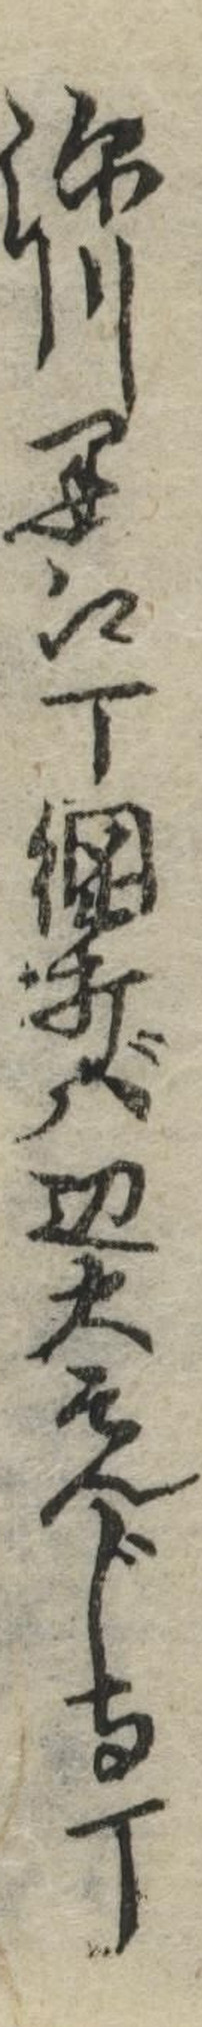深川黒江丁網打バ辺大そんじ寺丁
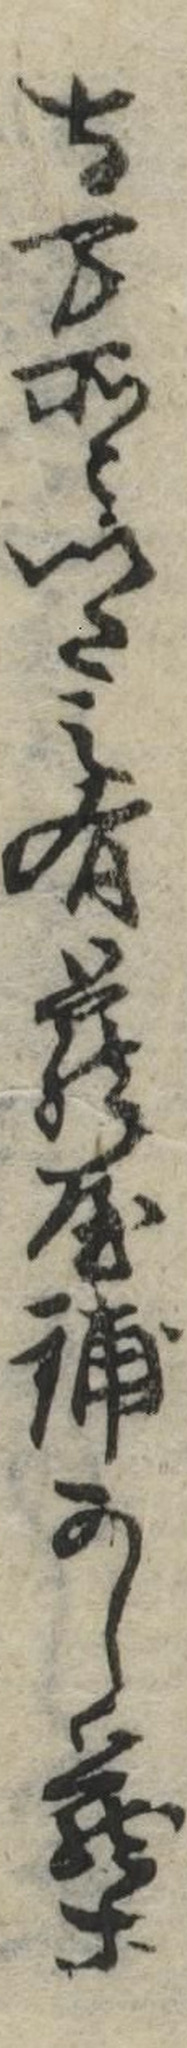寺方所〻いたミ有蔵屋舗かし蔵等
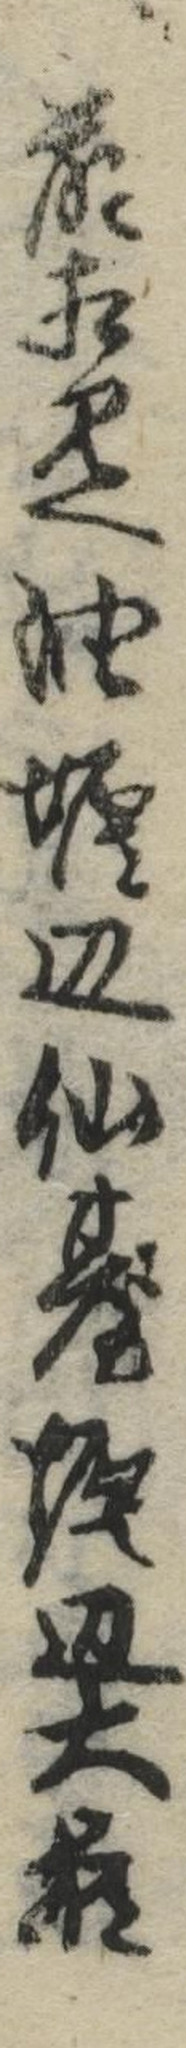崩相見へ油堀辺仙台堀辺大崩
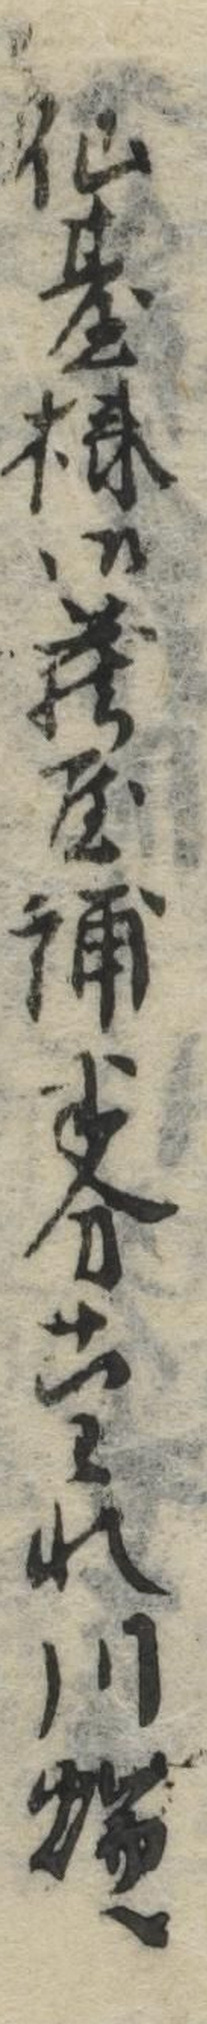仙台様御蔵屋敷半分こわれ川端
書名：安政三年辰八月廿五日夜　大江都御屋敷方寺社市中共　大嵐水入場所明細書之寫　并街道筋近郷聞書
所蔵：東京大学地震研究所図書室 Earthquake Research Institute Library, The University of Tokyo, JAPAN
